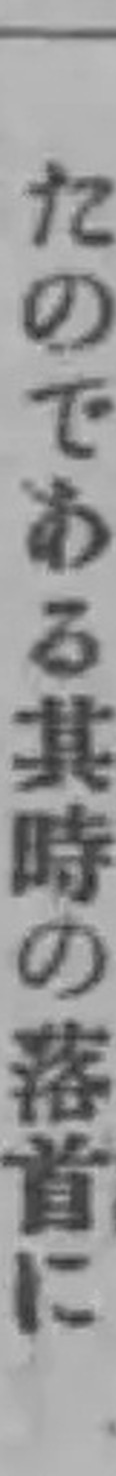たのである其時の落首に
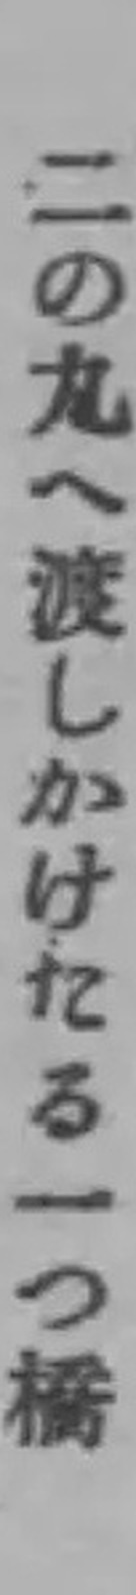二の丸へ渡しかけたる一つ橋
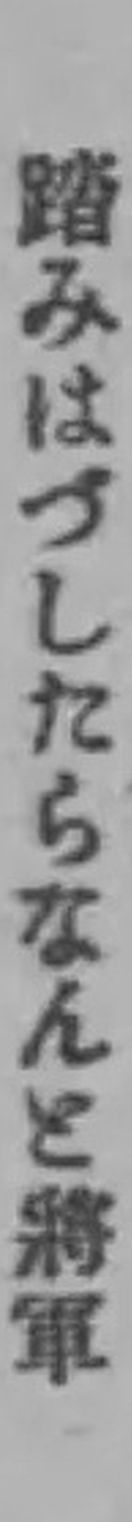踏みはづしたらなんと将軍
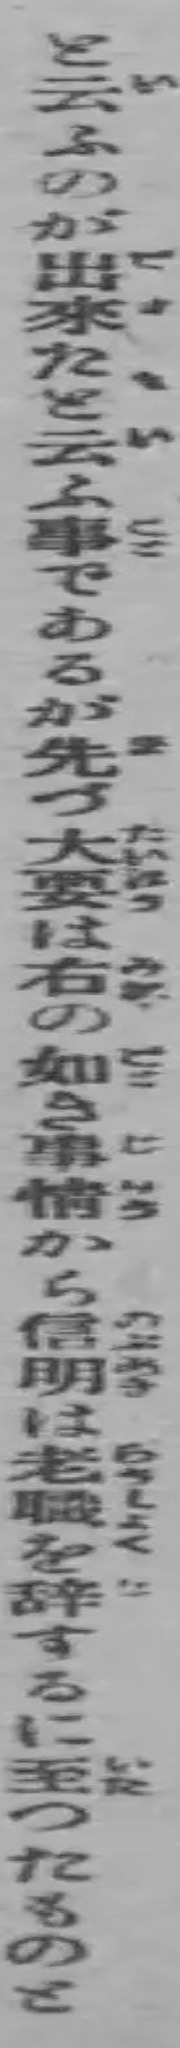と云ふのが出来たと云ふ事であるが先づ大要は右の如き事情から信明は老職を辞するに至つたものと
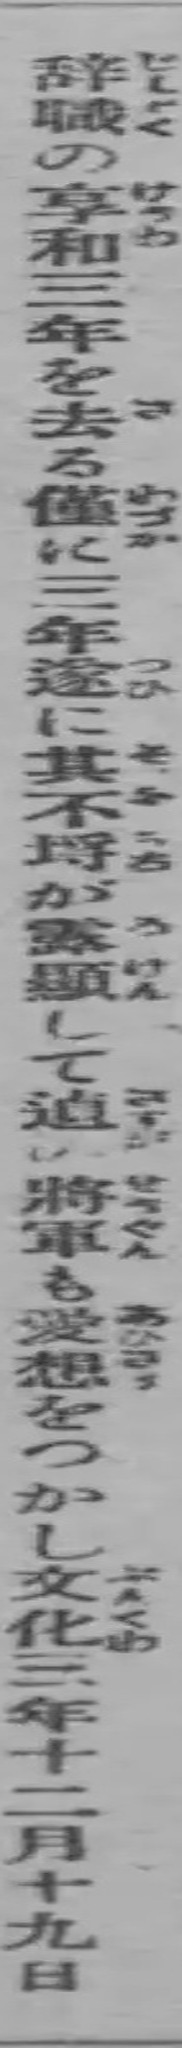辞職の享和三年を去る僅に三年遂に其不埒が露顕して遉の将軍も愛想をつかし文化三年十二月十九日
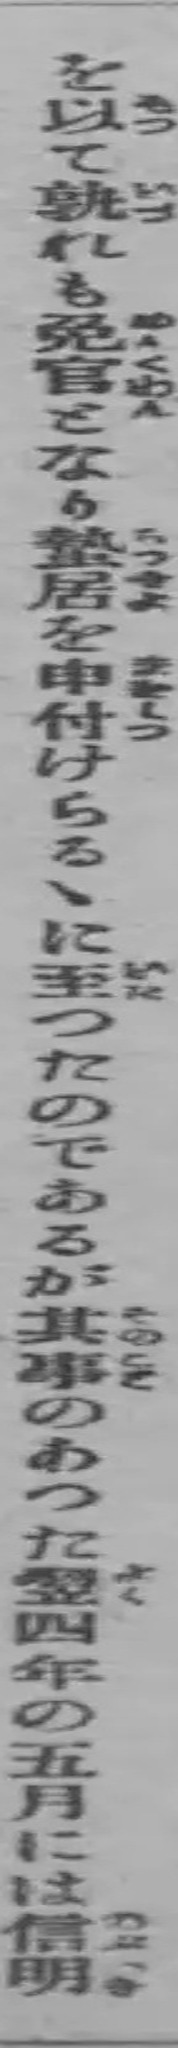を以て孰れも免官となり蟄居を申付けらるゝに至つたのであるが其事のあつた翌四年の五月には信明
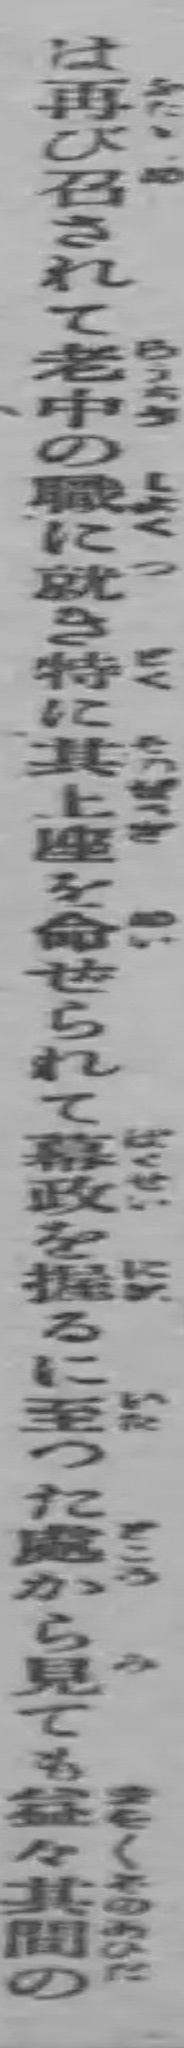は再び召されて老中の職に就き特に其上座を命ぜられて幕政を握るに至つた処から見ても益々其間の
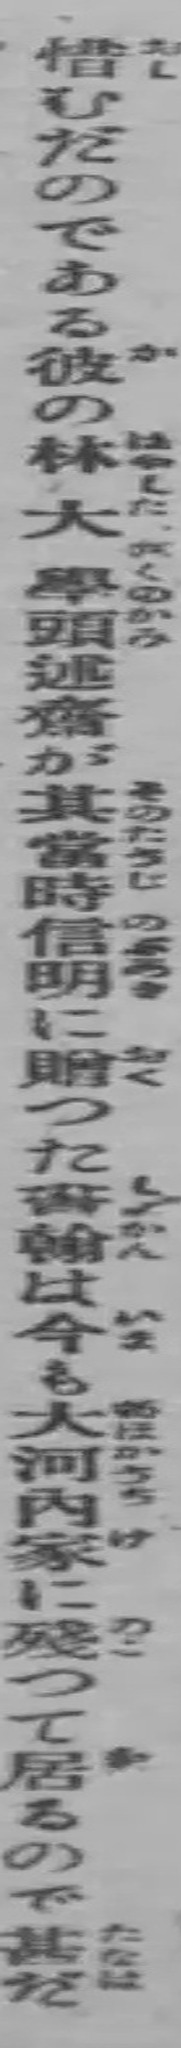惜むだのである彼の林大学頭述斉が其当時信明に贈つた書翰は今も大河内家に残つて居るので甚だ
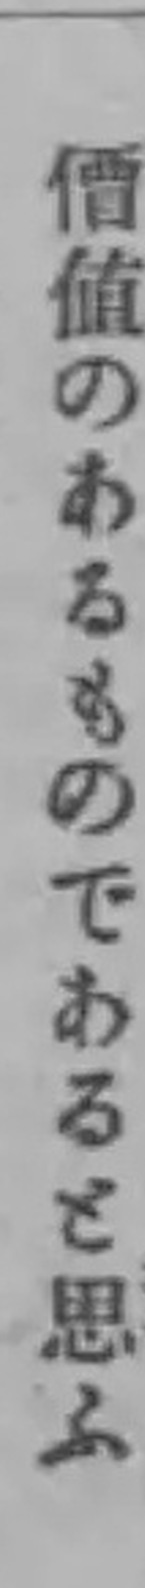価値のあるものであると思ふ
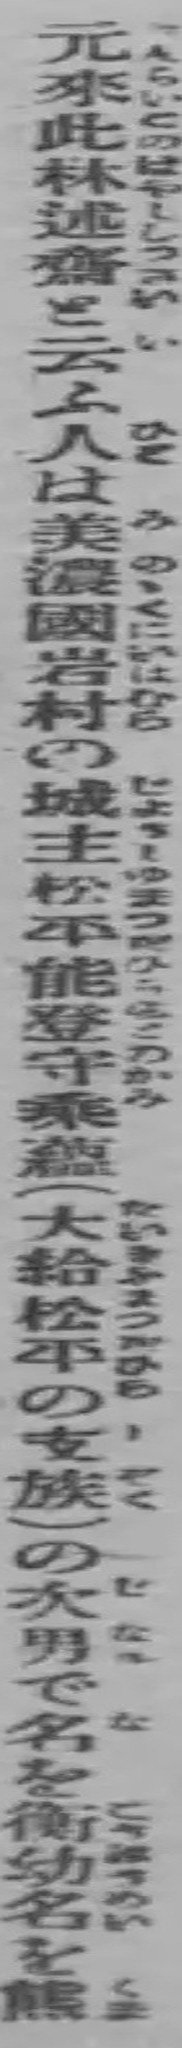元来此林述斉と云ふ人は美濃国岩村の城主松平能登守乗蘊(大給松平の支族)の次男で名を衡幼名を熊
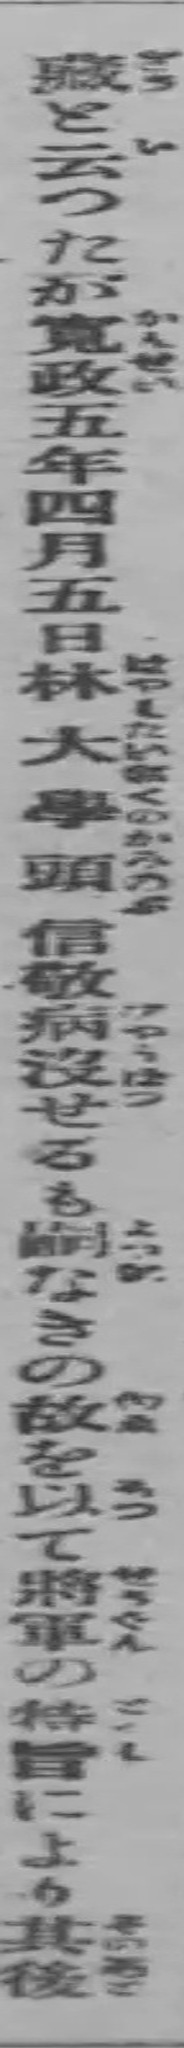蔵と云つたが寛政五年四月五日林大学頭信敬病没せるも嗣なきの故を以て将軍の特旨により其後
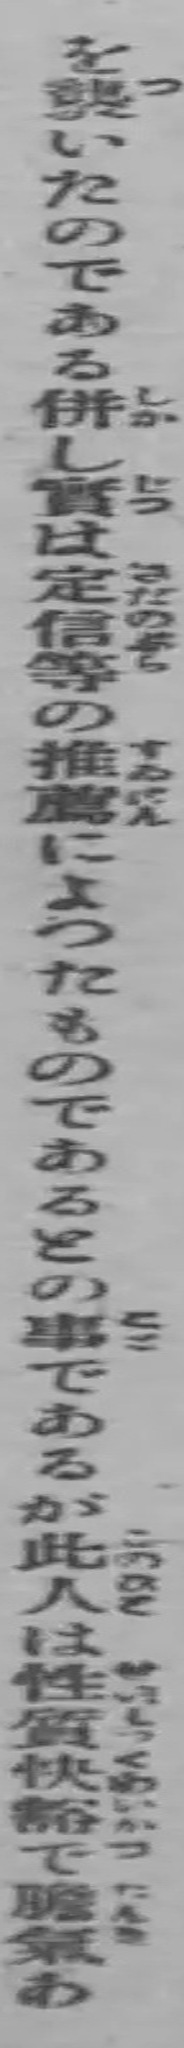を襲いたのである併し実は定信等の推薦によつたものであるとの事であるが此人は性質快豁で胆気あ
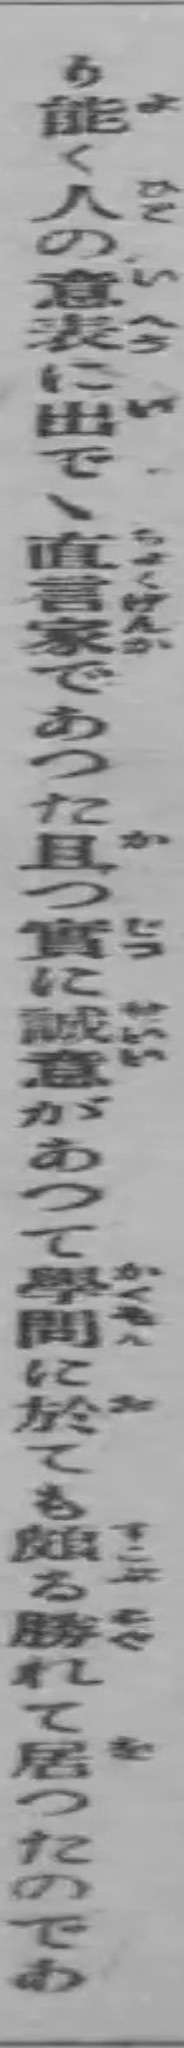り能く人の意表に出でゝ直言家であつた且つ実に誠意があつて学問に於ても頗る勝れて居つたのであ
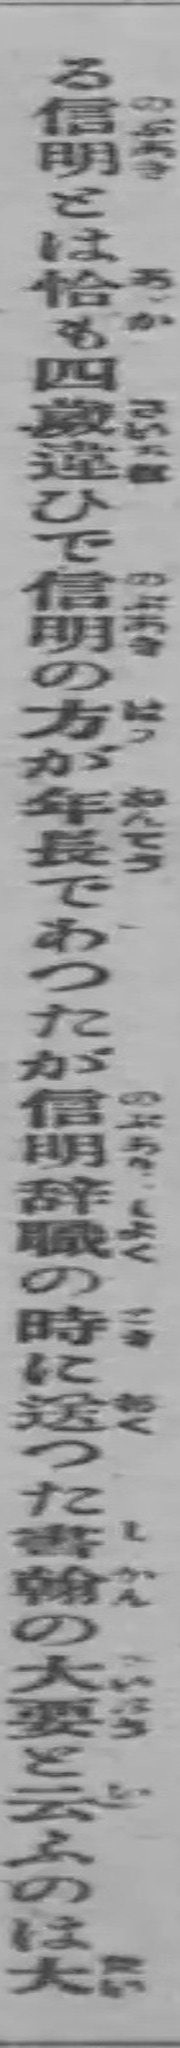る信明とは恰も四歳違ひで信明の方が年長であつたが信明辞職の時に送つた書翰の大要と云ふのは大
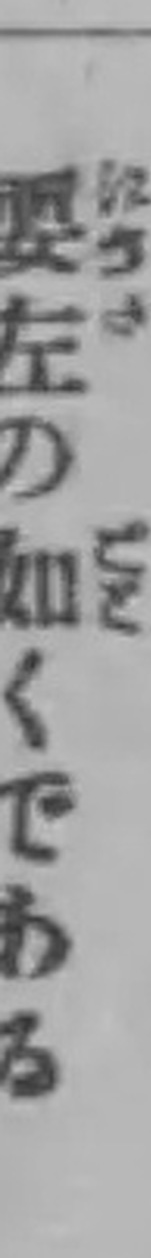要左の如くである
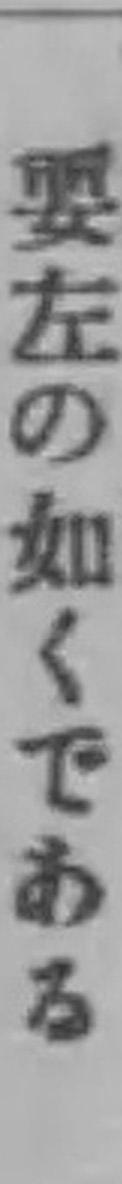要左の如くである
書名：豊橋市史談
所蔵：国立国会図書館 National Diet Library, JAPAN
